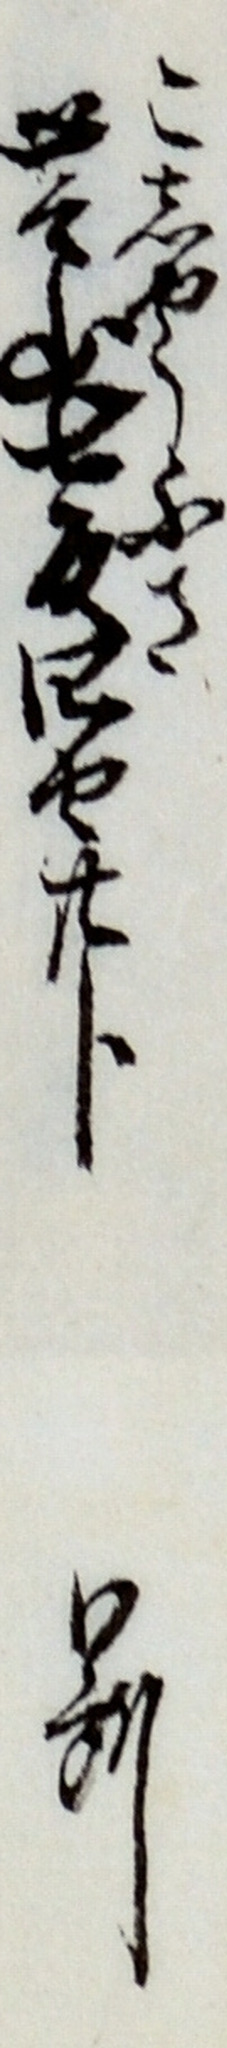芝山七反四セ廿歩同断
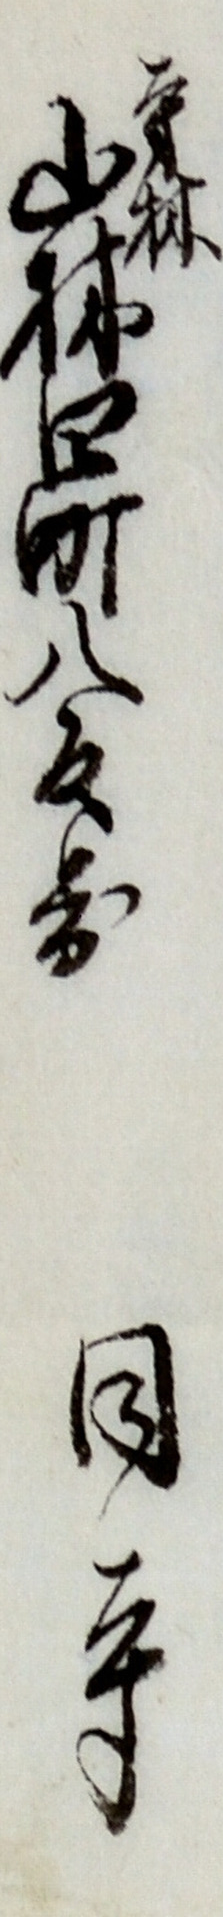山林四町八反歩同寺

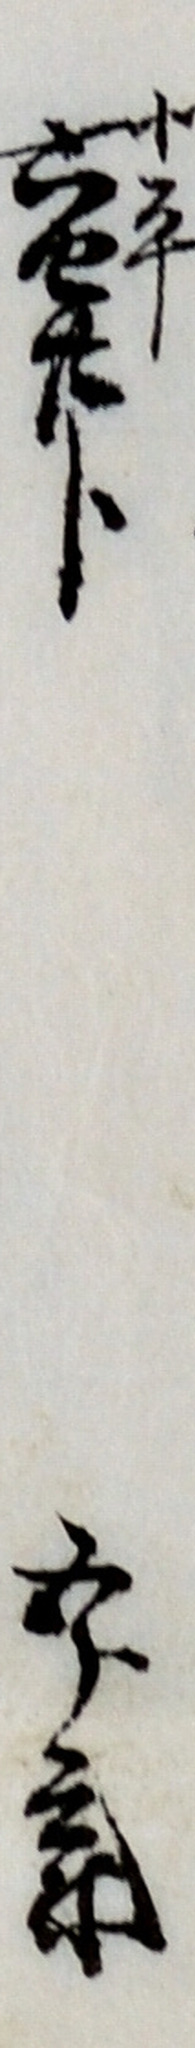六セ廿歩五郎兵衛
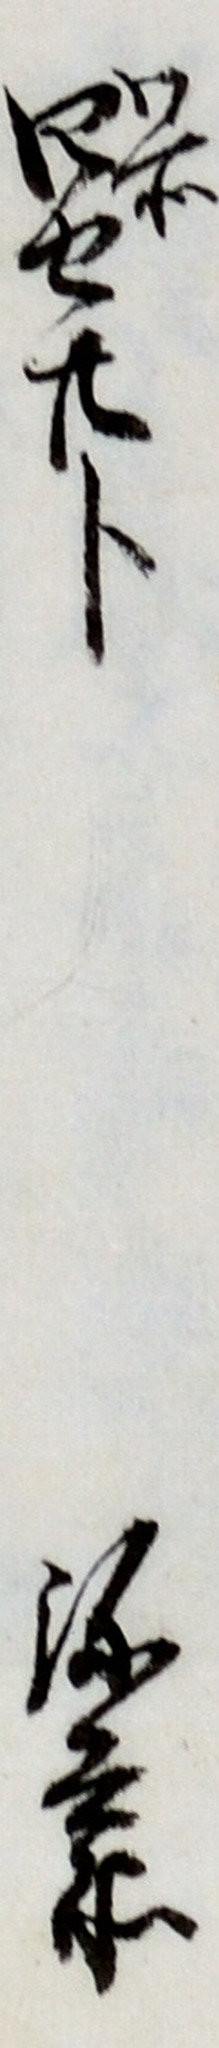四セ廿ぶ弥兵衛
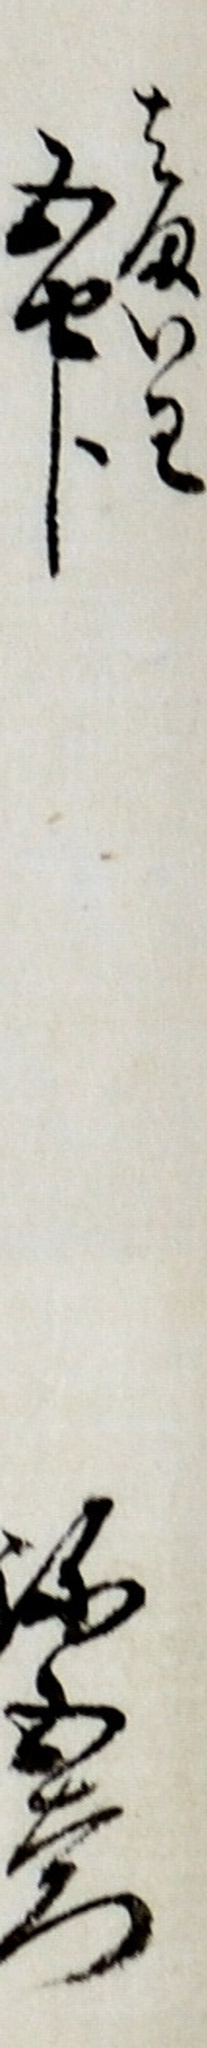五セ歩弥五右衛門
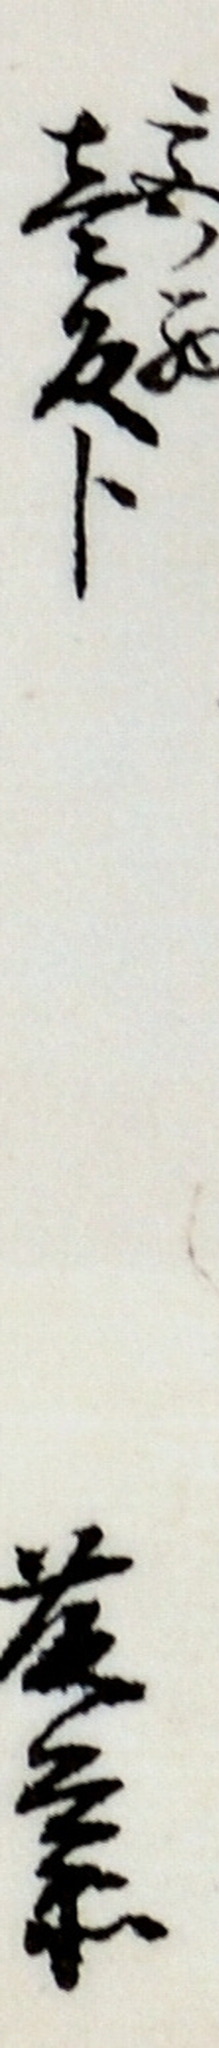壱反歩藤兵衛
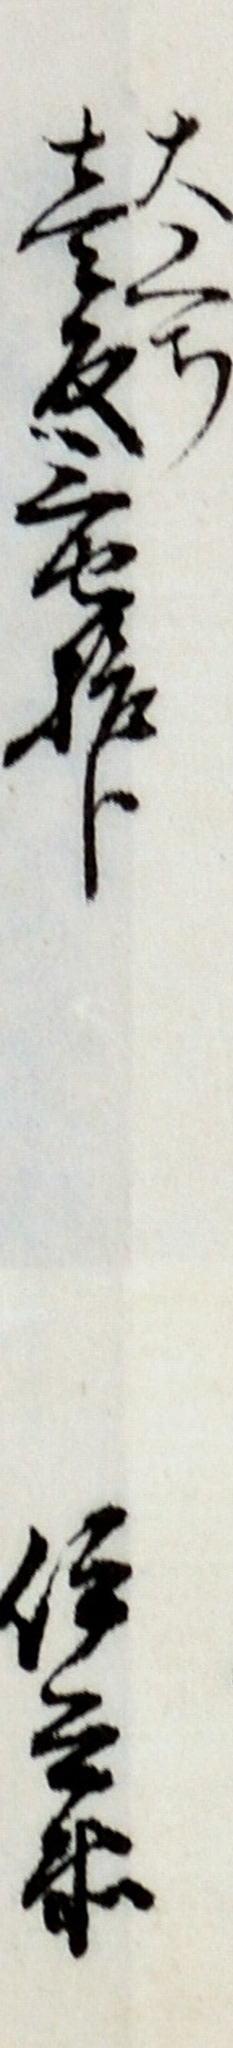壱反三セ拾歩伊兵衛
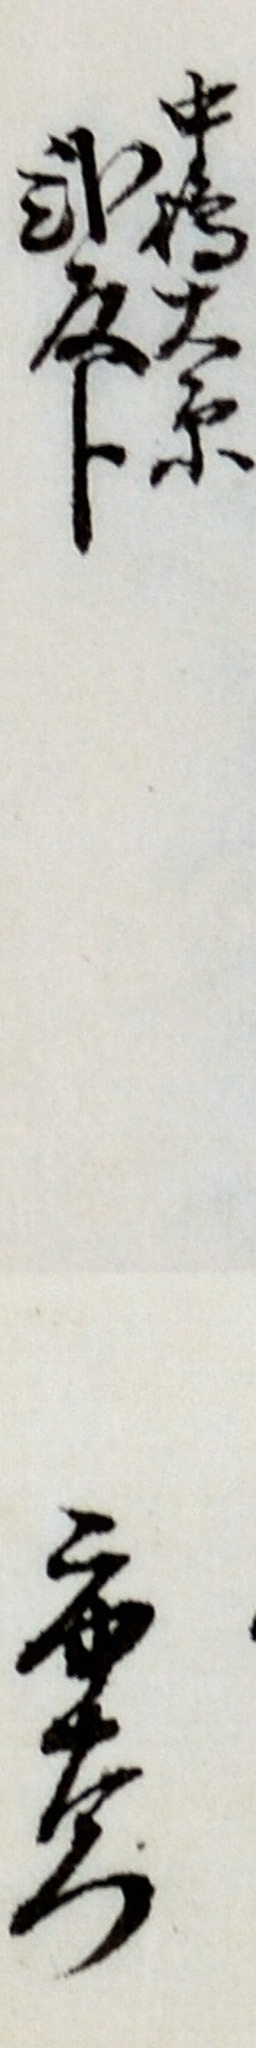弐反歩市右衛門
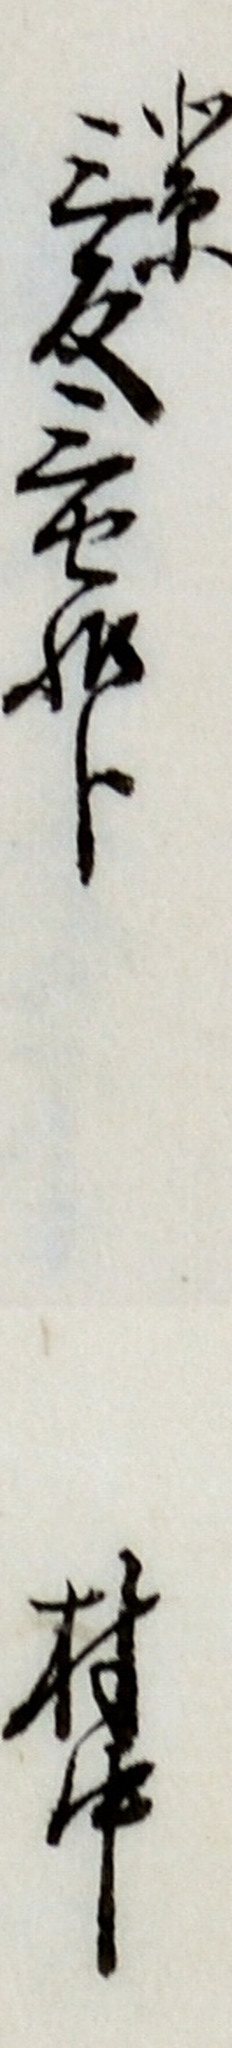三反三セ拾歩村中
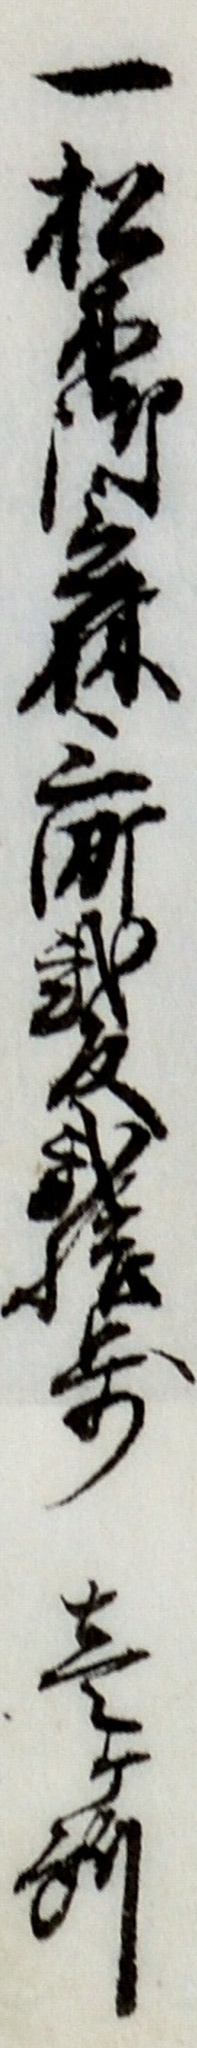一松木御立林三町弐反弐拾歩壱ケ所
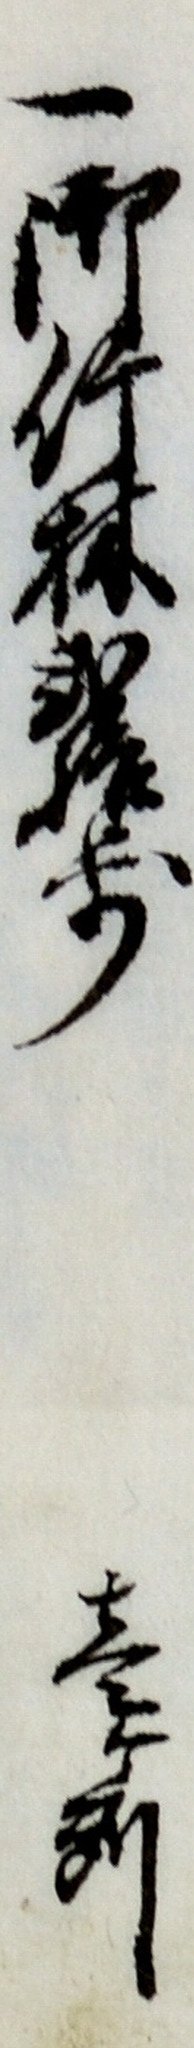一御竹林弐拾歩壱ケ所
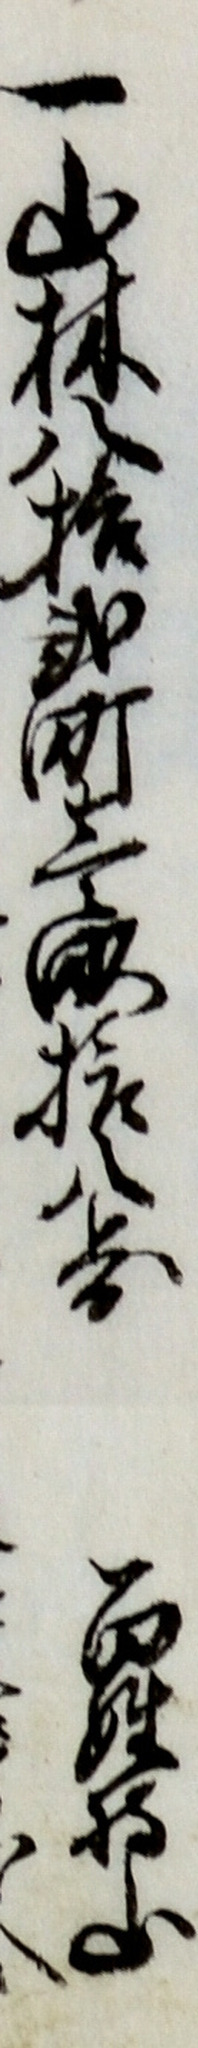一山林八拾弐町壱畝拾八歩百姓持山
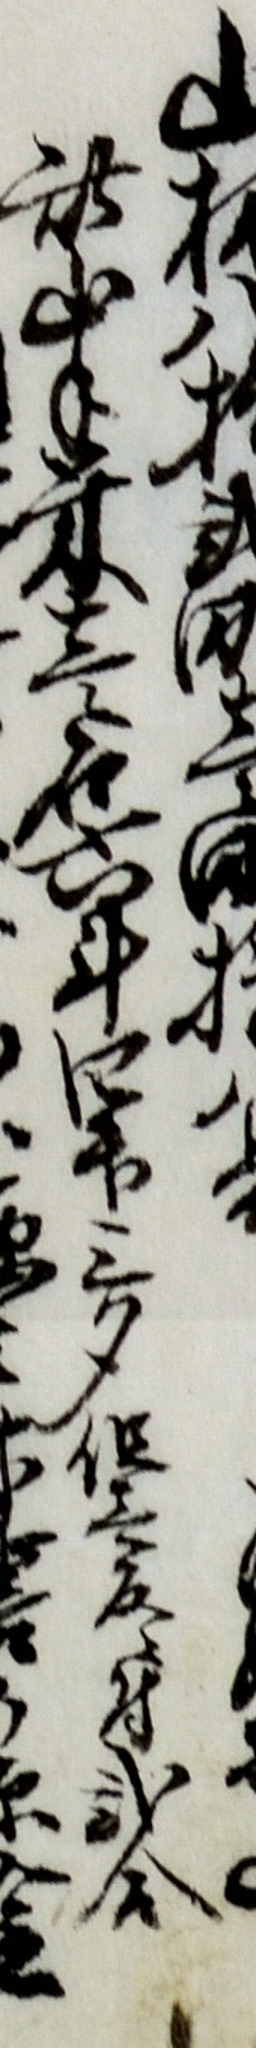此山手米壱石六斗四升三勺但壱反ニ付弐合
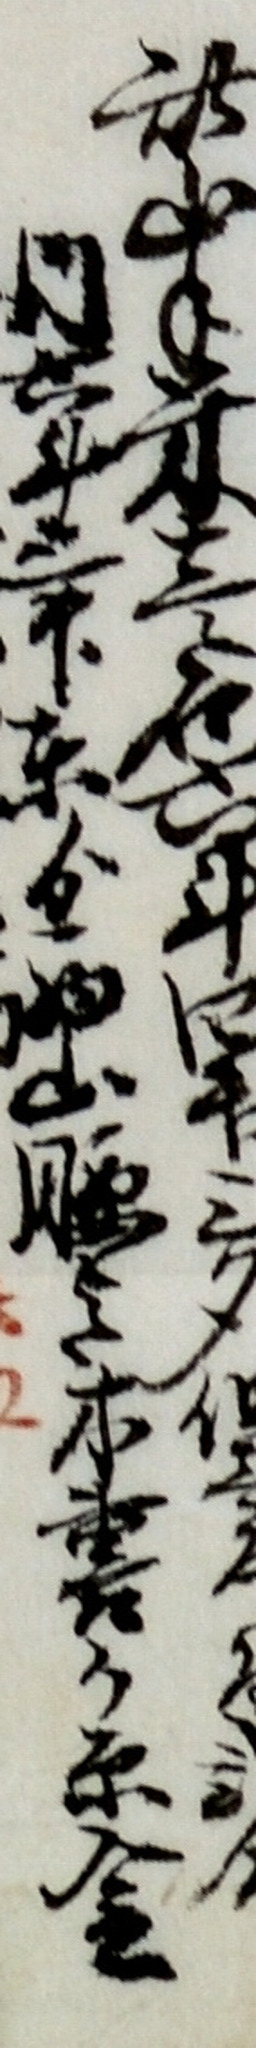内六斗三升東より西山腰迄木裏ゕ原入主

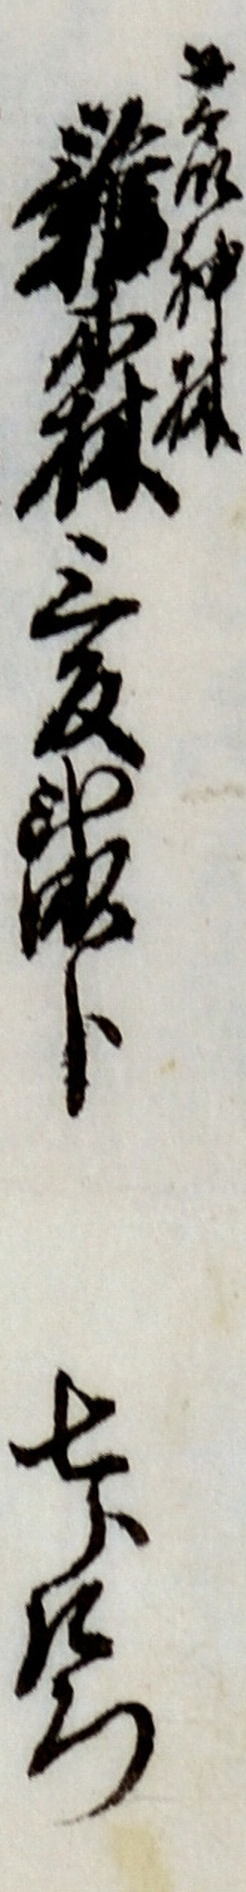雑木林三反弐畝歩七郎左衛門
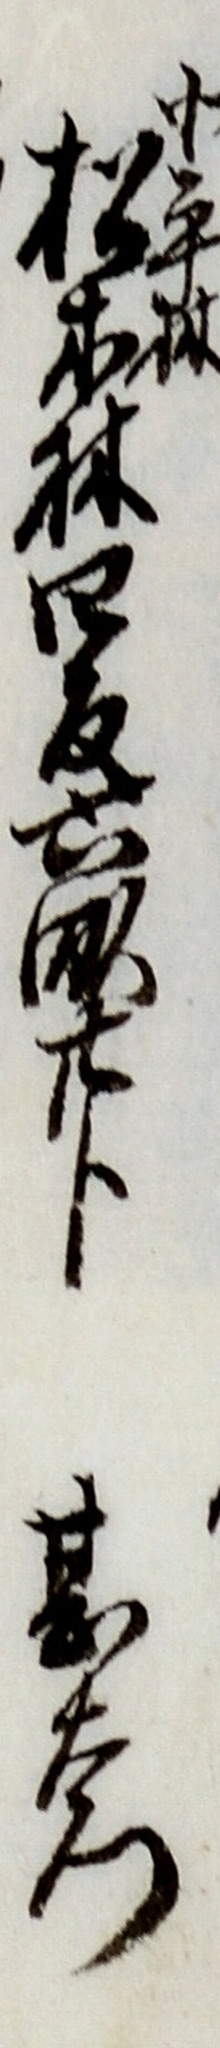松木林四反六畝廿歩甚右衛門
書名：御領分中山林社地手控
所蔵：伊那市立高遠町図書館・合同会社AMANE
